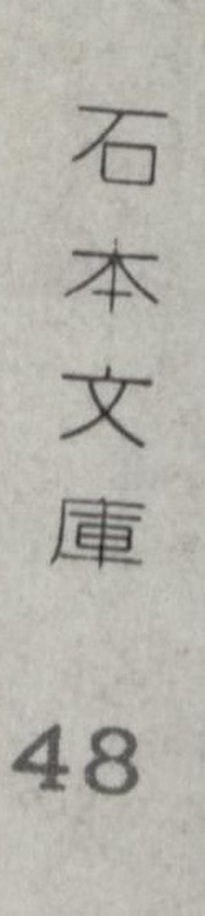石本文庫
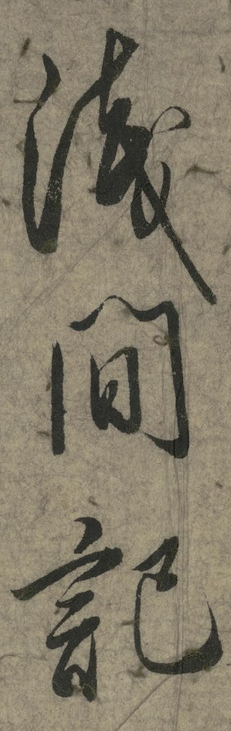浅間記

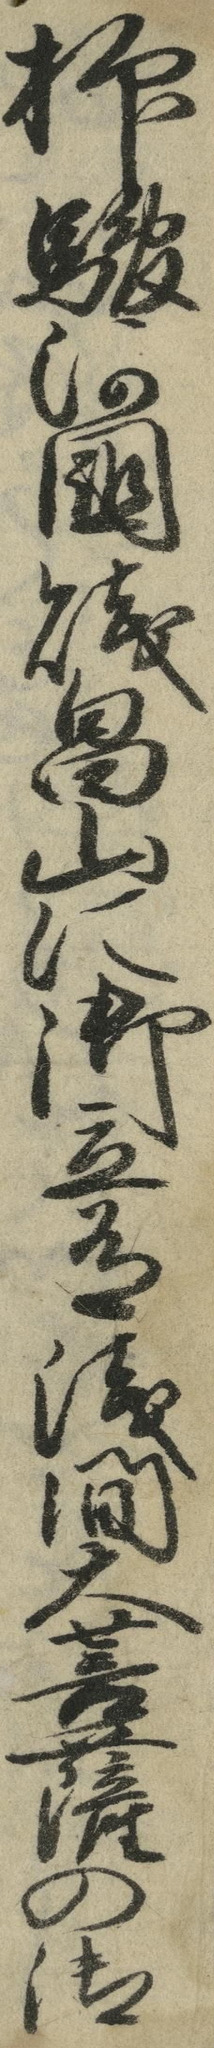抑駿河国賤畠山に御立有浅間大菩薩の御
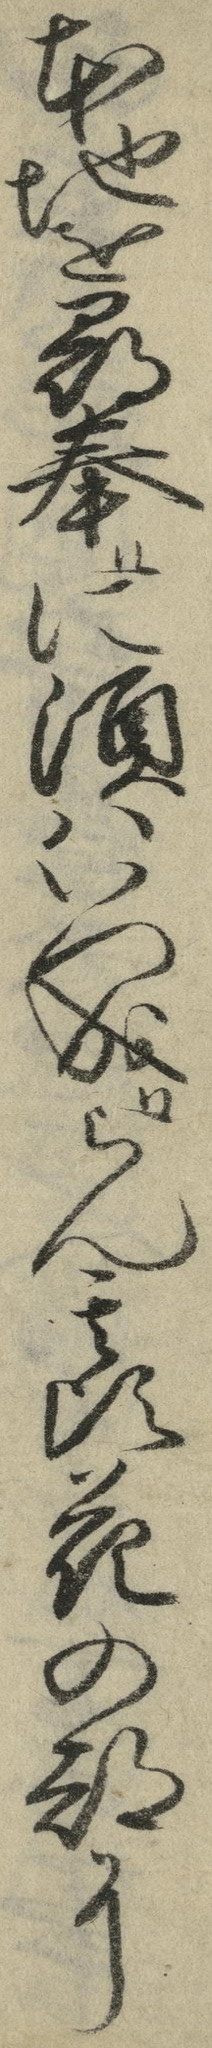本地を尋奉ルに頃ハいつ成ルらん其頃花の都に
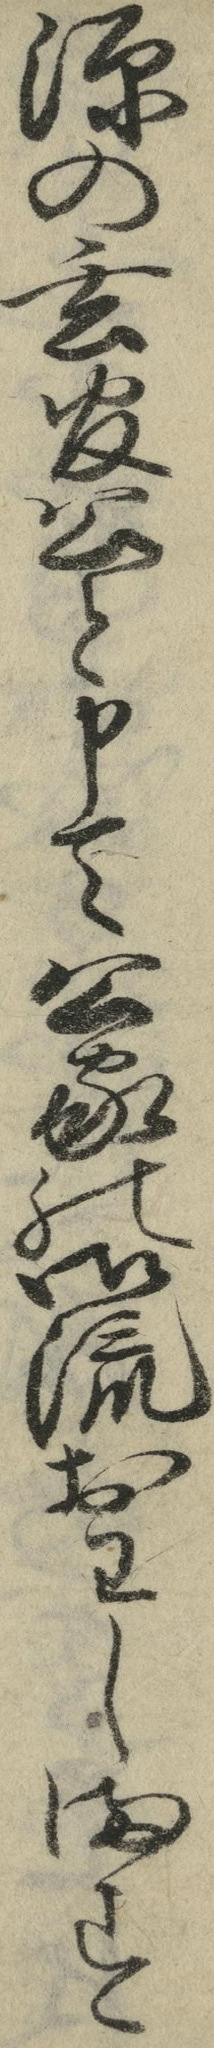源の玄官公と申て公家の御流おわします
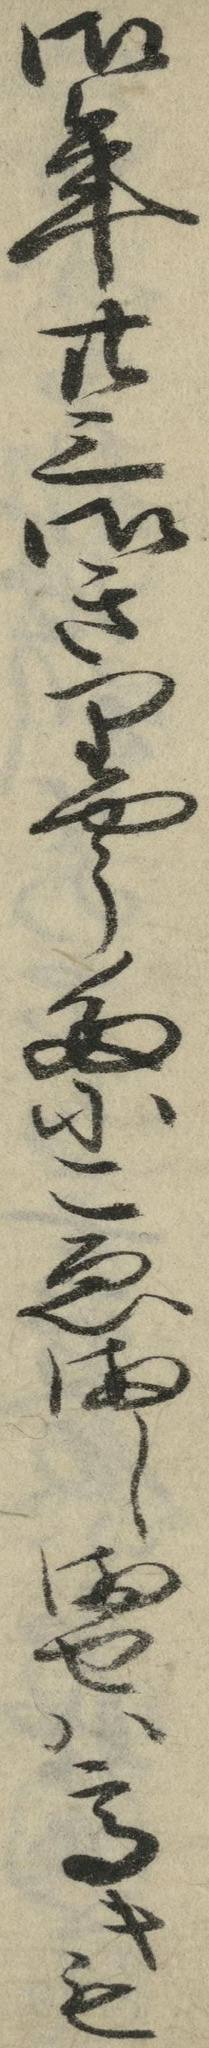御年廿三御きりやうたにこゑましませハ高キも
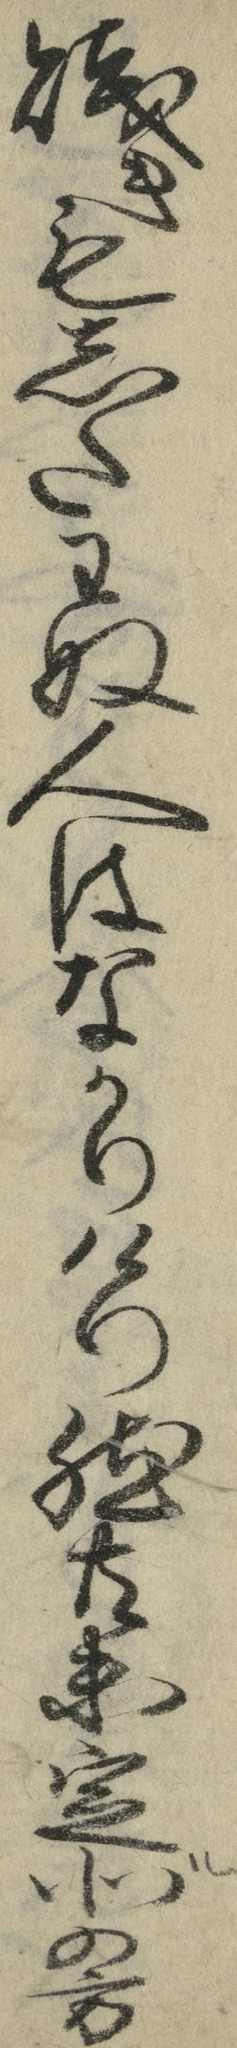賤キもしたわぬ人はなかりけり然共未定ル北の方
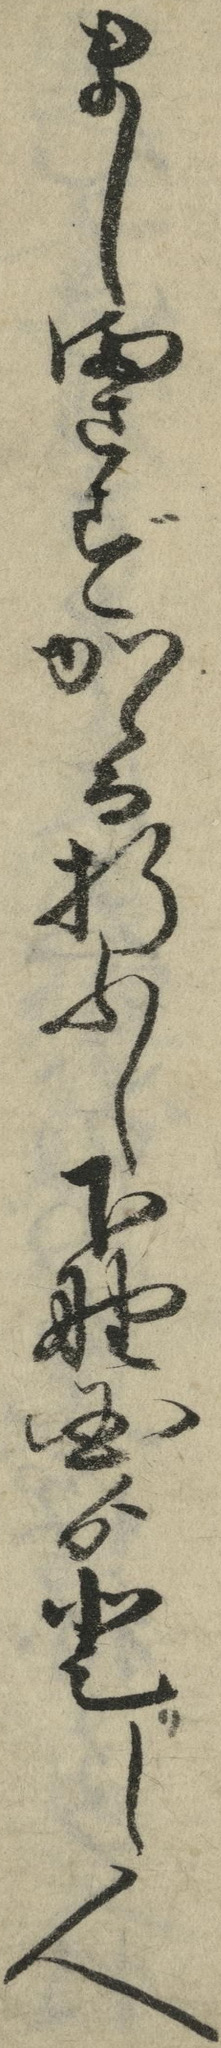ましまさずかゝる折ふし下野国ゟ登リし人
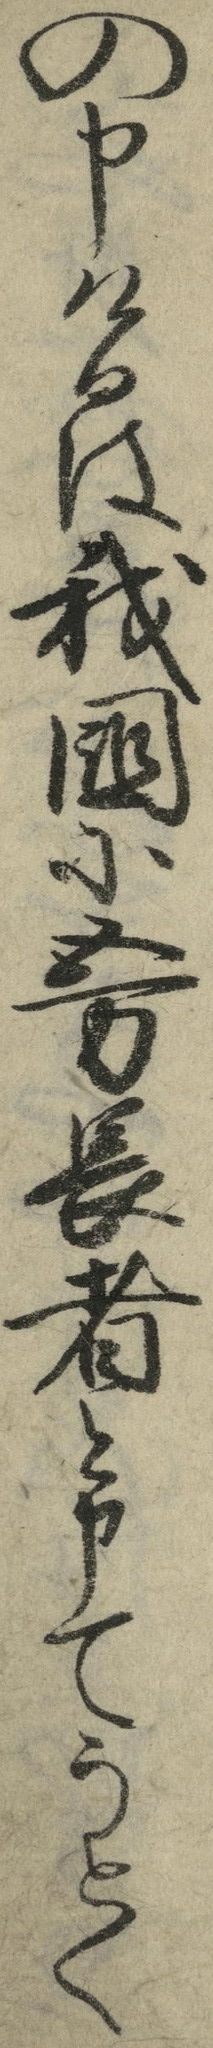の申けるは我国に五万長者と申てうとく
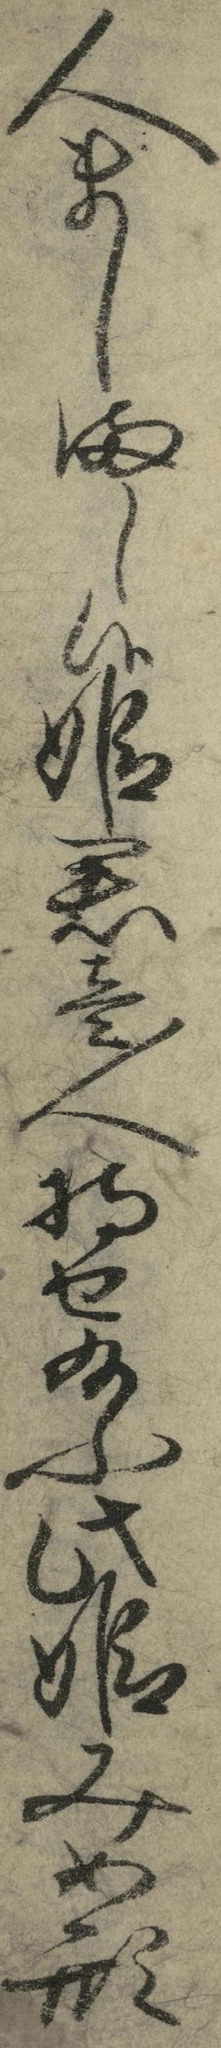人ましまし候姫君壱人持せ給ふ此姫みめ形
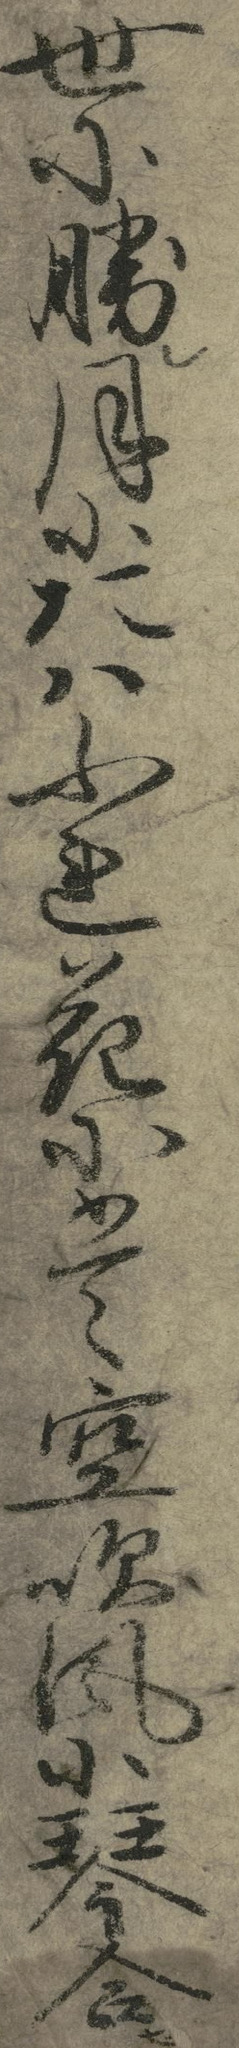世に勝レ月にたハふれ花にめて空吹風に琴合セ

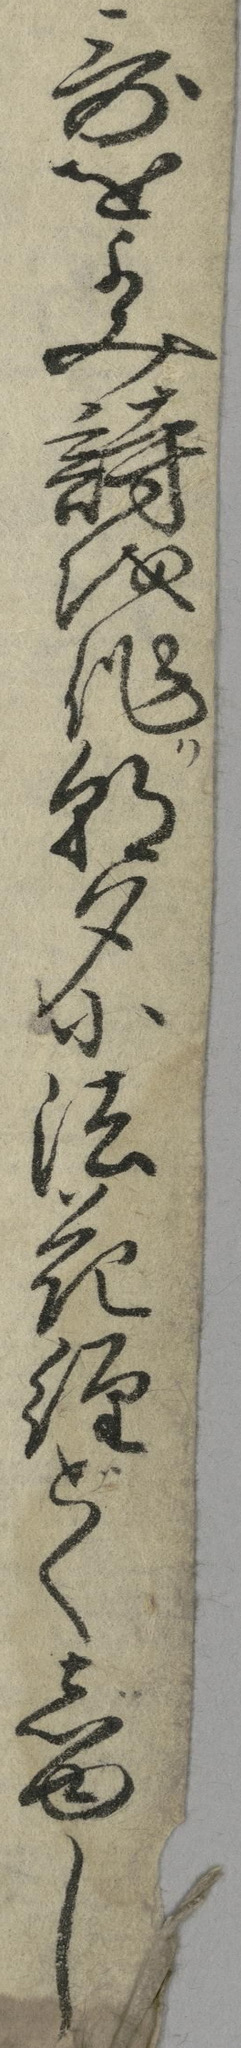哥をよみ詩を作リ朝夕に法花経どくじゆし
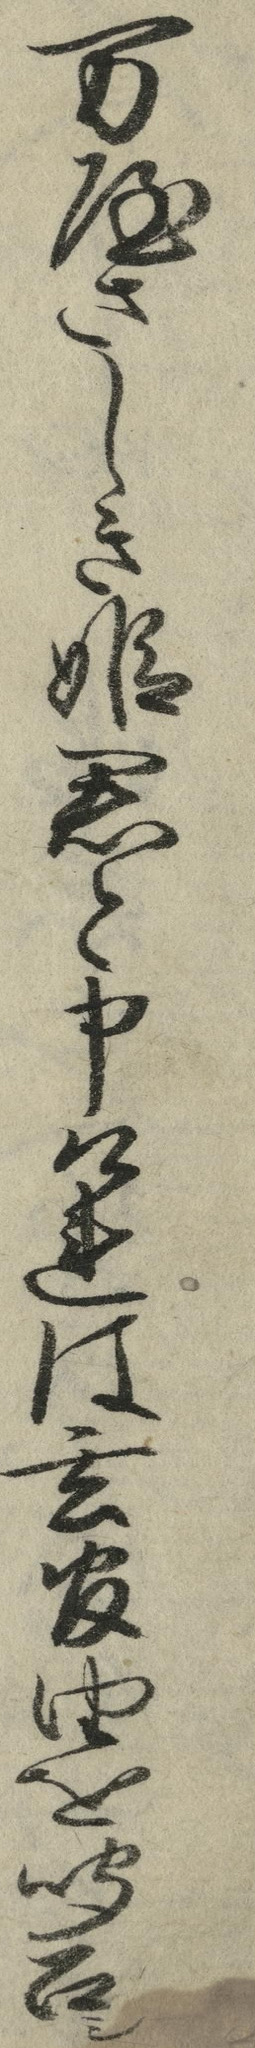万やさしき姫君と申けれは玄官由を聞召シ
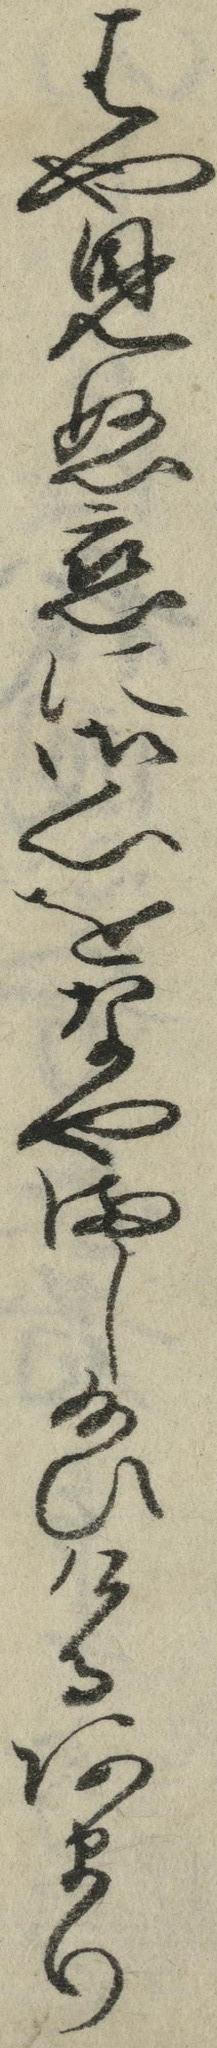はや見ぬ恋に御心をなやまし給ひけるあまり
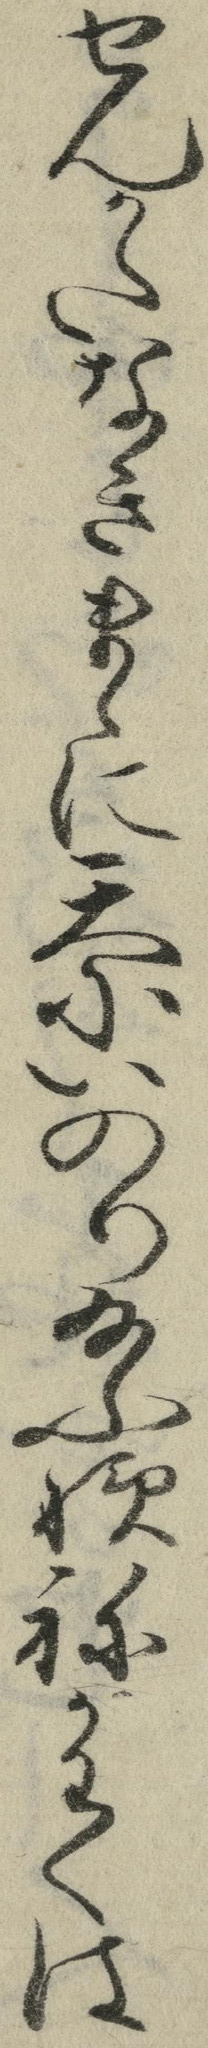せんかたなきまゝに天にいのり給ふ様ねがわくは
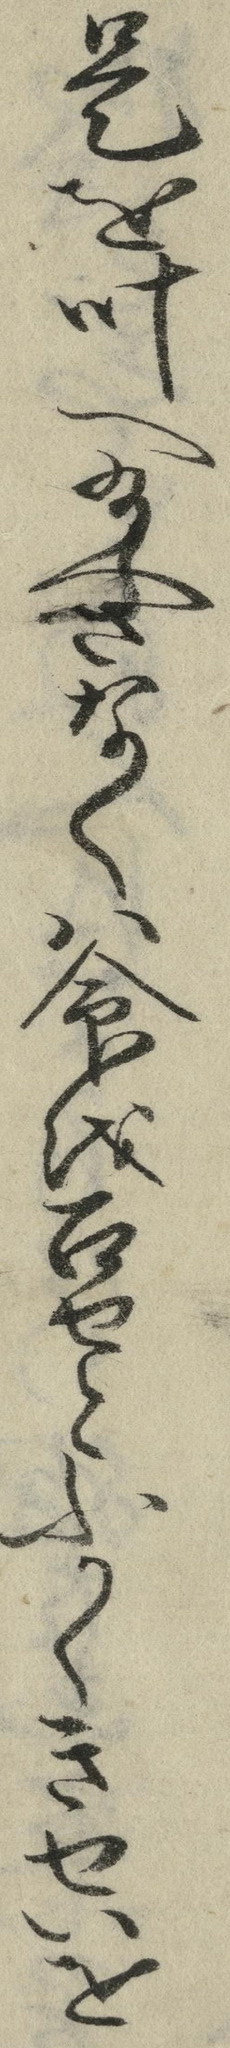是を叶へ給へさなくは命を召せとふかくきせいを
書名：浅間記
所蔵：東京大学地震研究所図書室 Earthquake Research Institute Library, The University of Tokyo, JAPAN
